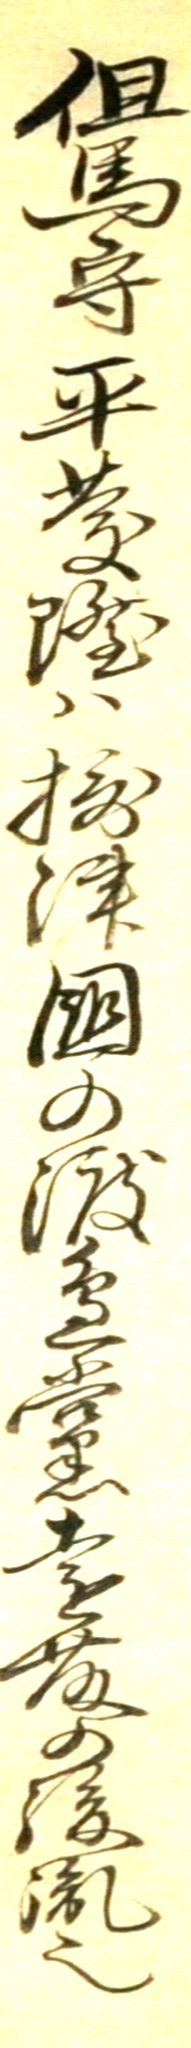但馬守平慶隆は摂津国の渡辺党遠藤の後胤也
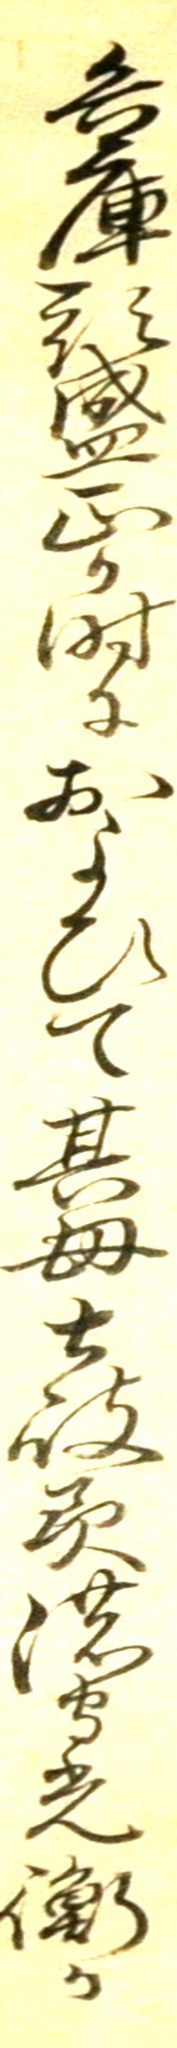兵庫頭盛正か時におよひて其母土岐美濃守光衡か
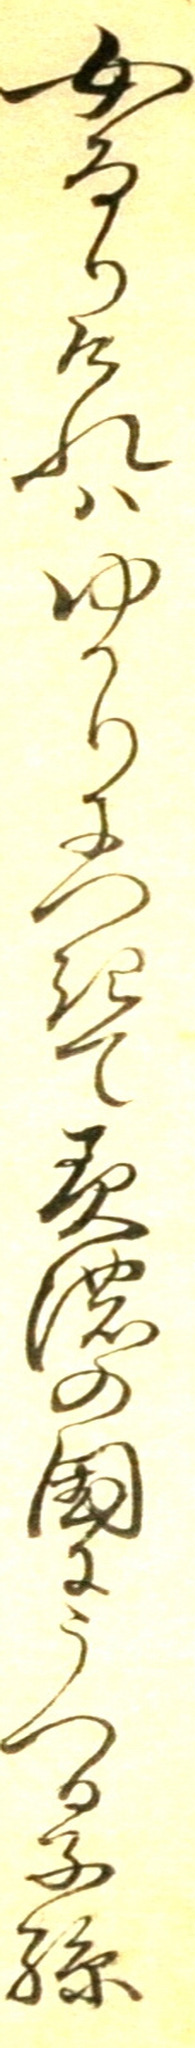女なりけれはゆかりにつきて美濃の国にうつる子孫
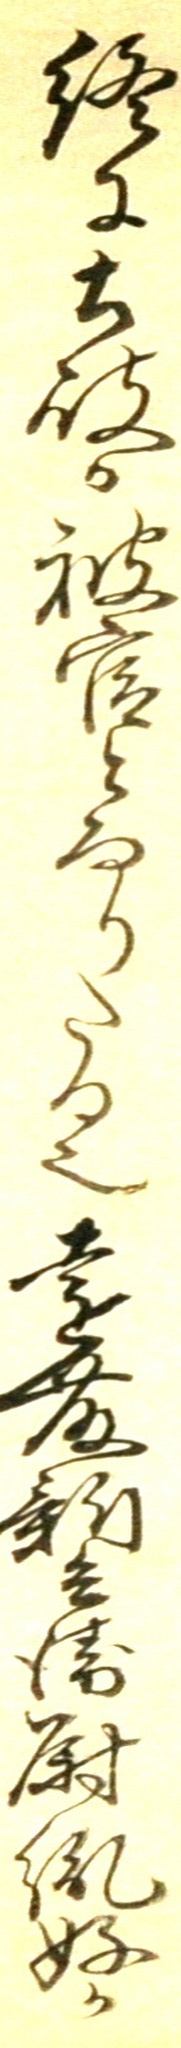終に土岐か被官となりたる也遠藤新兵衛尉胤好か
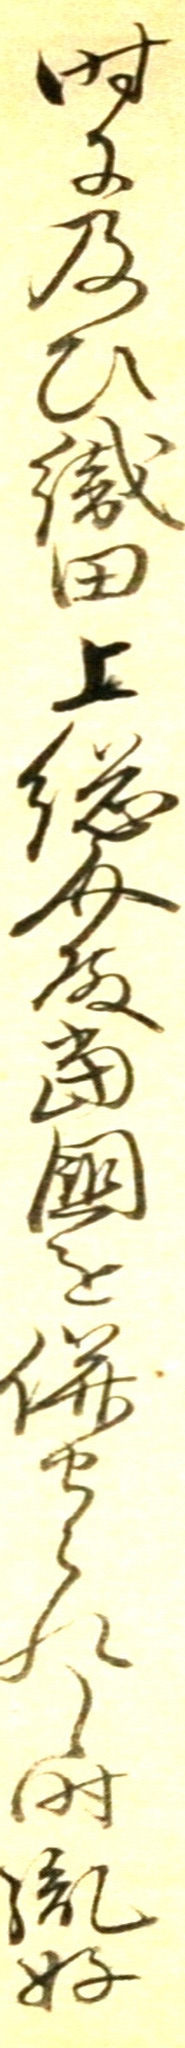時に及ひ織田上総介殿当国を併せられし時胤好
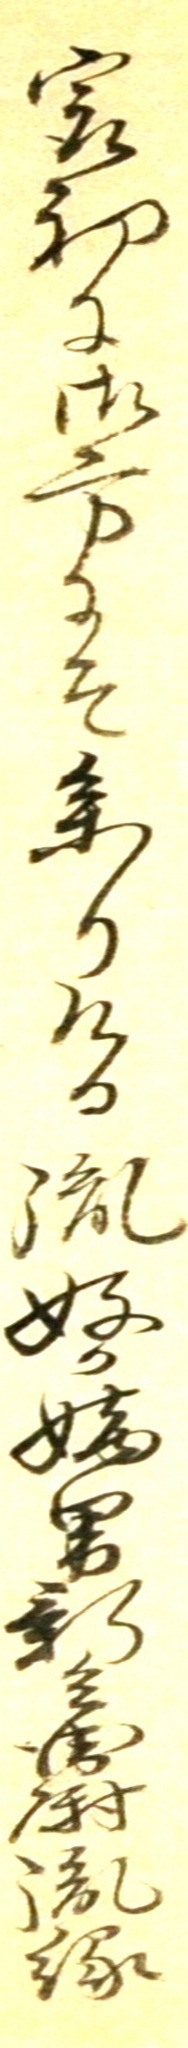最初に御方にそ参りける胤好か嫡男新兵衛尉胤縁
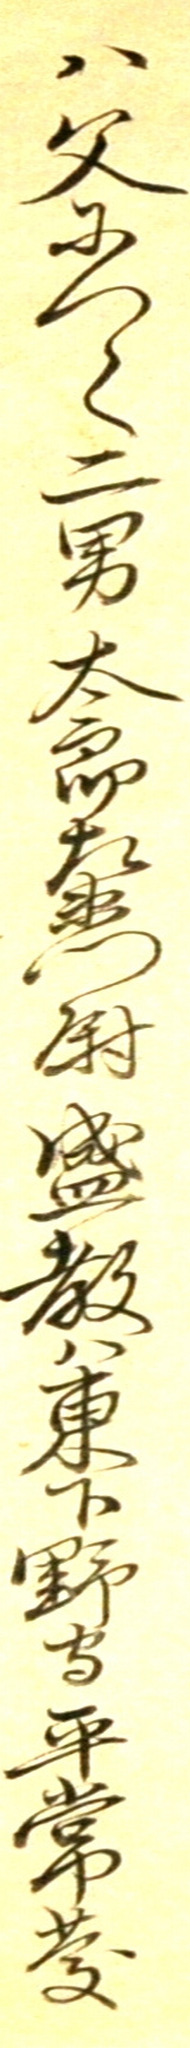は父につく二男太郎左衛門尉盛教は東下野守平常慶

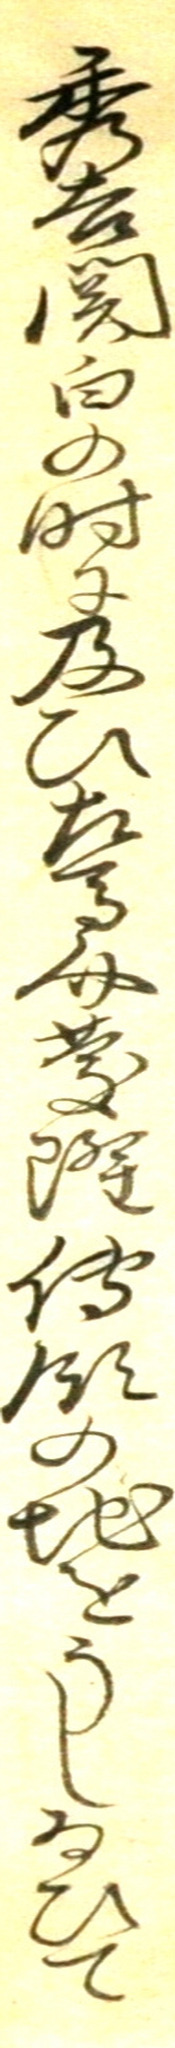秀吉関白の時に及ひ左馬介慶隆伝領の地をうしなひて
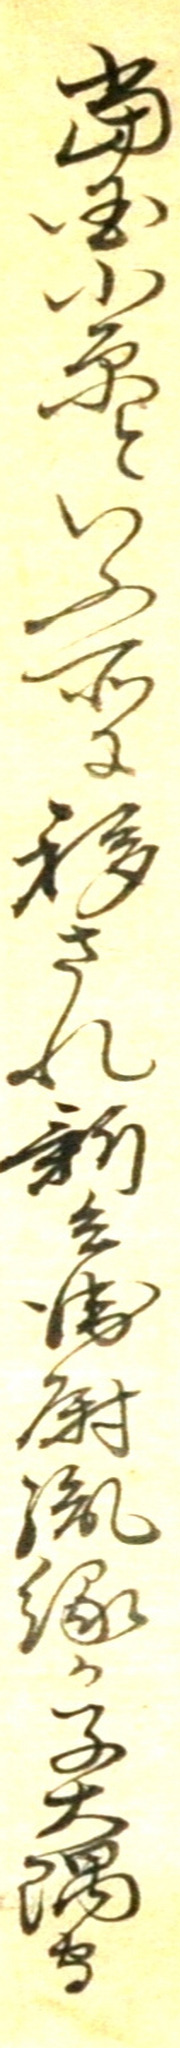当国小原といふ所に移され新兵衛尉胤縁か子大隅守
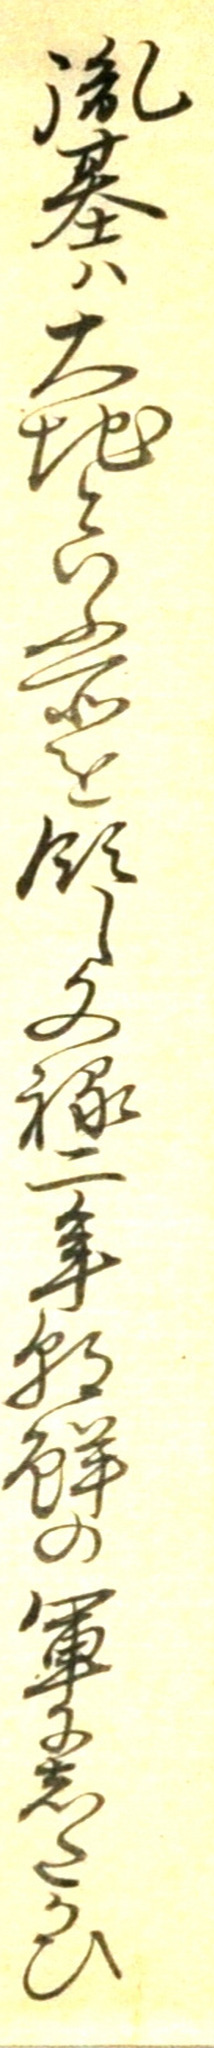胤基は大地といふ所を領し文禄二年朝鮮の軍にしたかひ
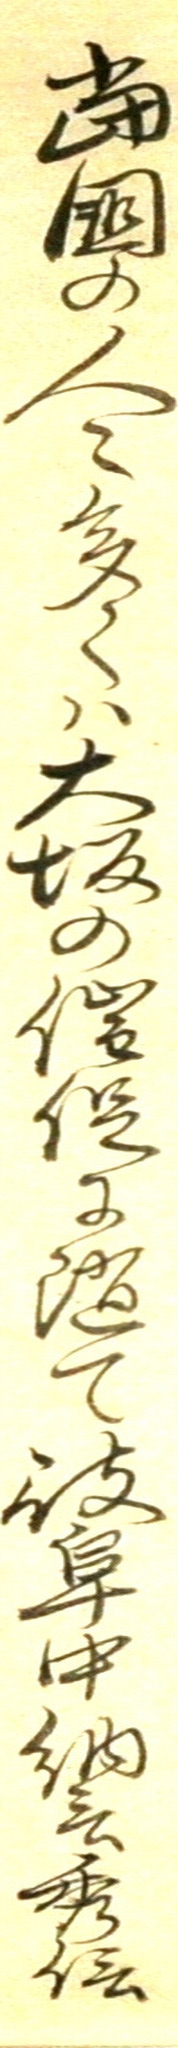当国の人々多くは大坂の催促に随て岐阜中納言秀信
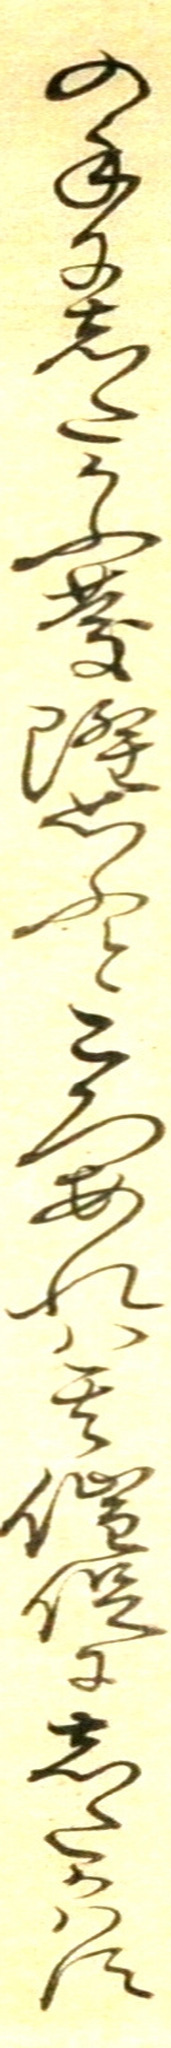の手にしたかふ慶隆思ふところあれは其催促にしたかはす
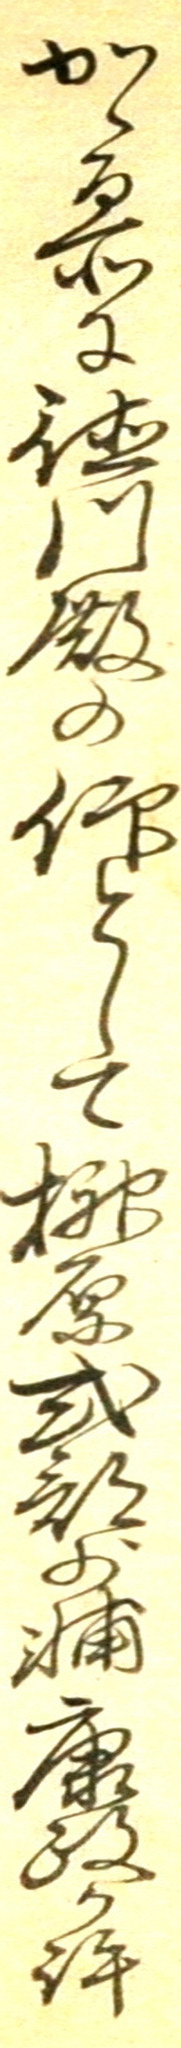かゝる所に徳川殿の仰として榊原式部少輔康政か許
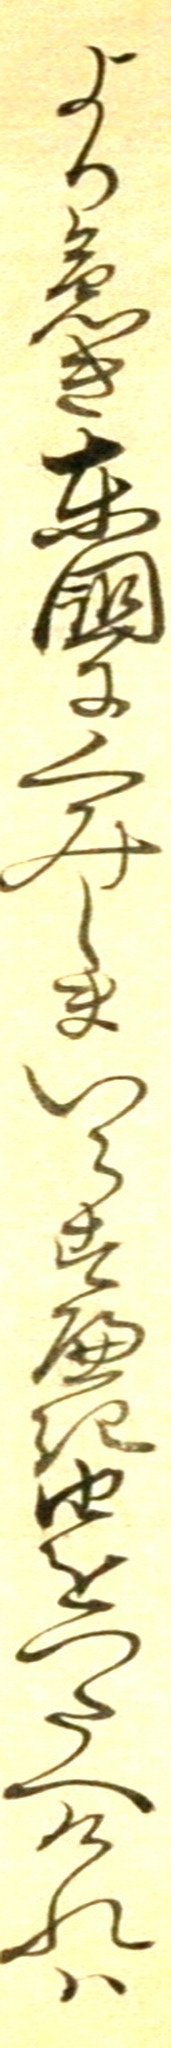より急き東国にくみしまいらすへき由をつたへけれは
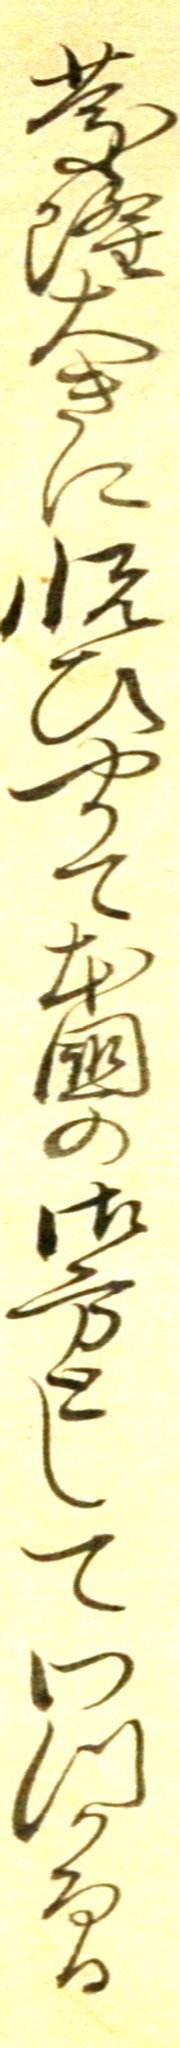慶隆大きに悦ひやかて本国の御方としてわつかなる
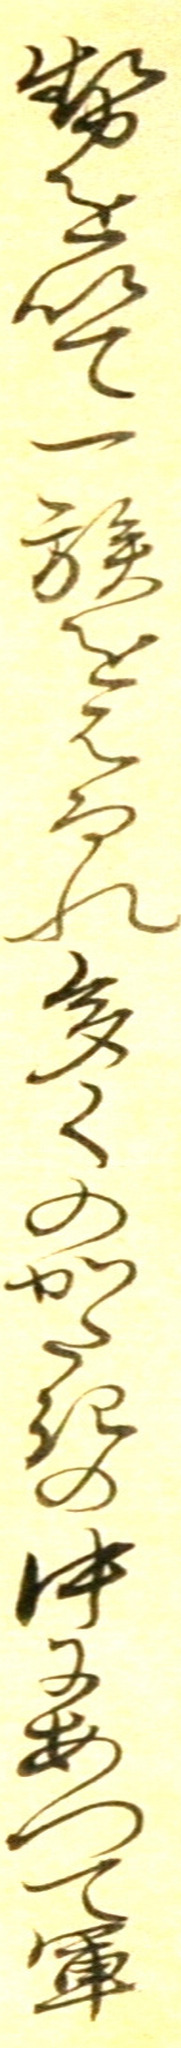勢を以て一族をはなれ多くのかたきの中にあつて軍
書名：藩翰譜（九・上）
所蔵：伊那市立高遠町図書館・合同会社AMANE
